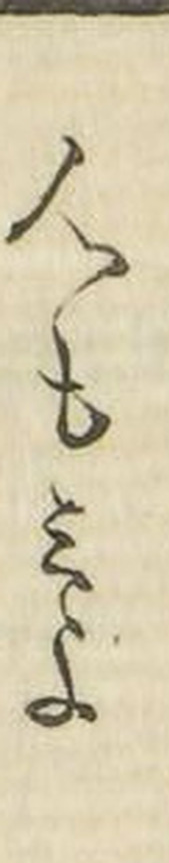人もみよ
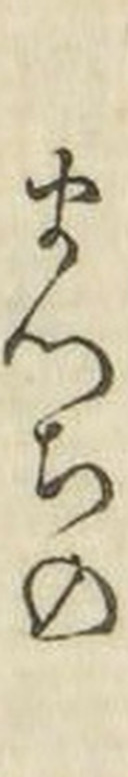まつちの
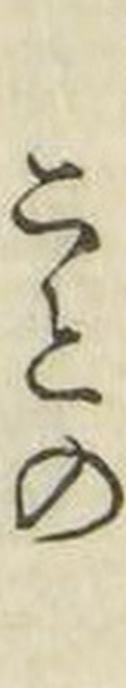ことの
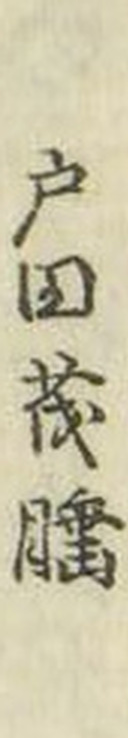戸田茂睡

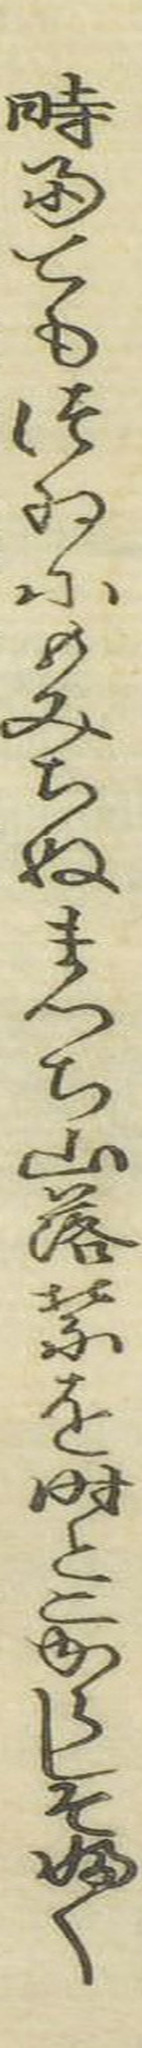時雨てもつゐにもみちぬまつち山落葉を時とこからしそふく同
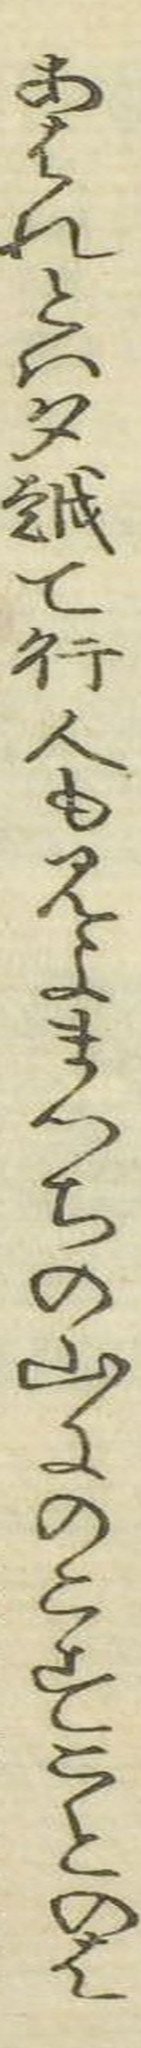あわれとは夕越て行人もみよまつちの山にのこすことのは茂睡
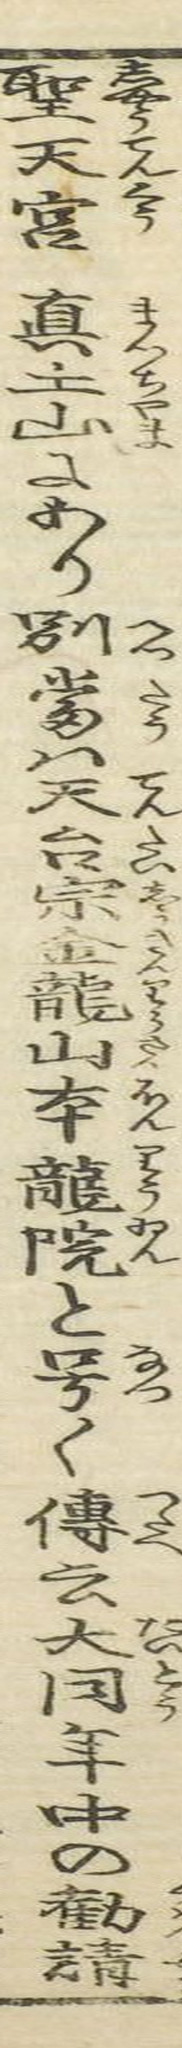聖天宮真土山にあり別当は天台宗金龍山本龍院と号く伝云大同年中の勧請
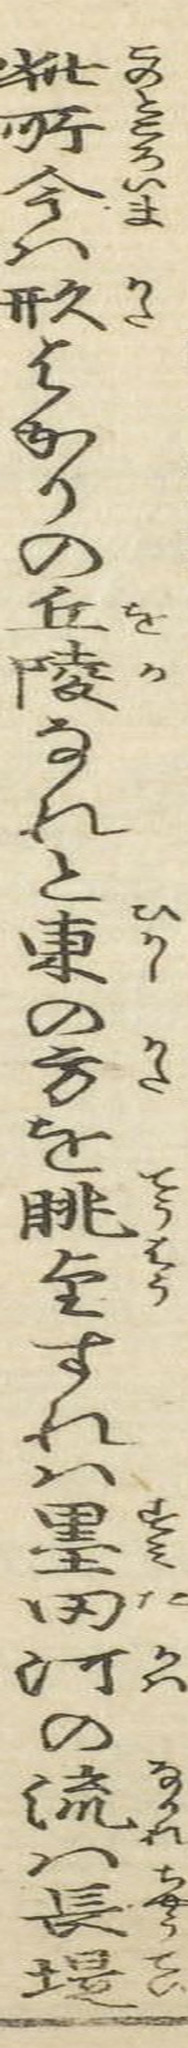此所今は形はかりの丘陵なれと東の方を眺望すれは墨田河の流は長堤
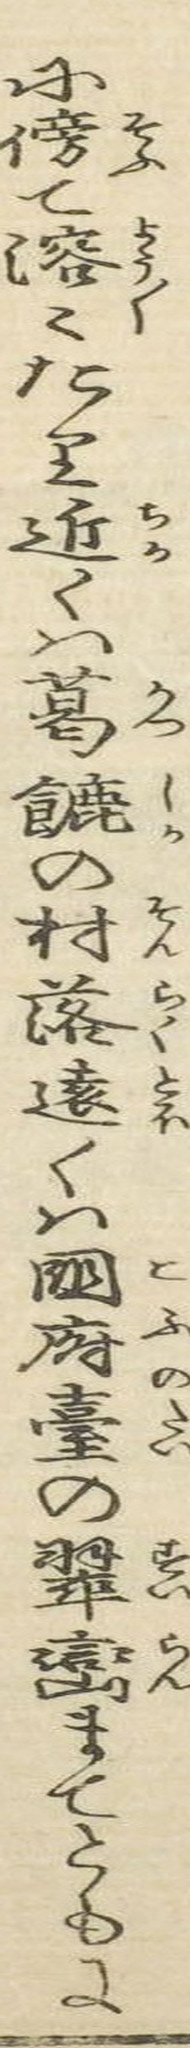に傍て溶々たり近くは葛飾の村落遠くは国府台の翠巒まてともに
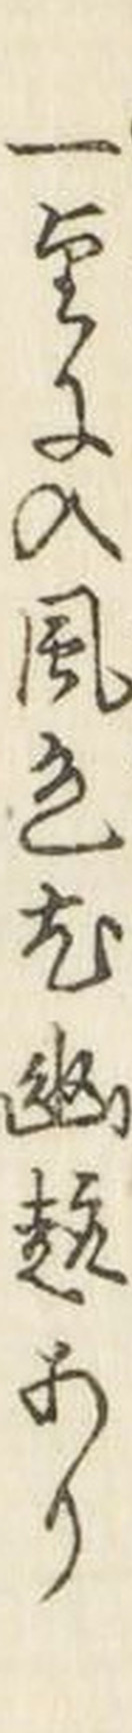一望に入風色尤幽趣あり

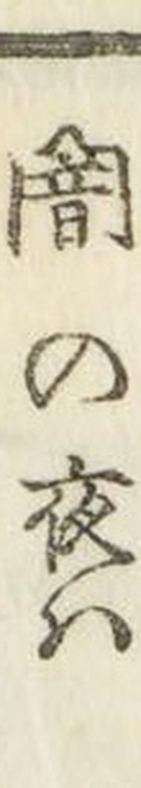闇の夜は
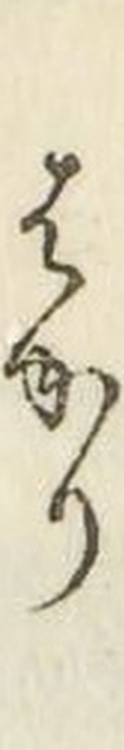はかり
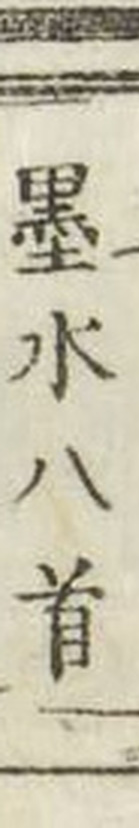墨水八首
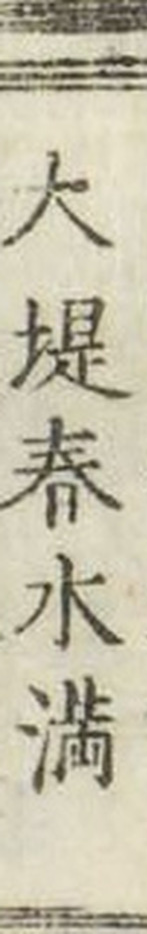大堤春水満
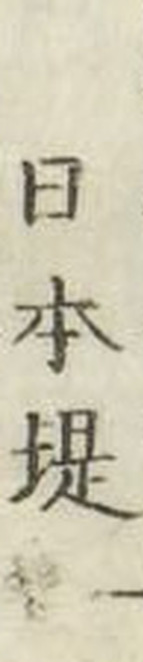日本堤
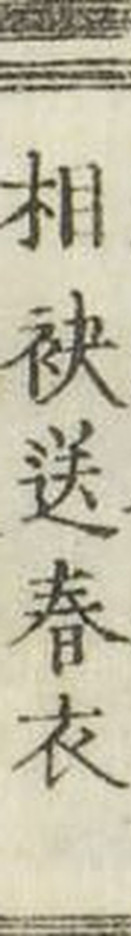相袂送春衣
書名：江戸名所図会 20巻 巻之17
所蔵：東京学芸大学教育コンテンツアーカイブ
